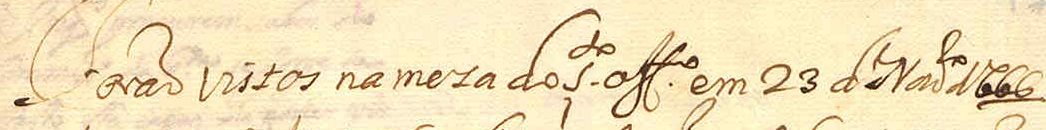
Foraõ vistos na meza do s.to off.o em 23 de Nouro d 666
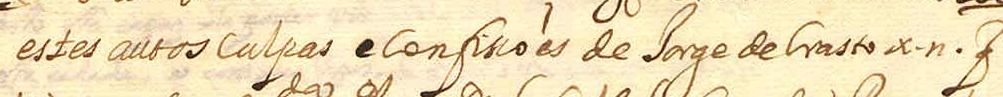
estes autos culpas e confissoẽs de Iorge de Crasto x. n. q̄
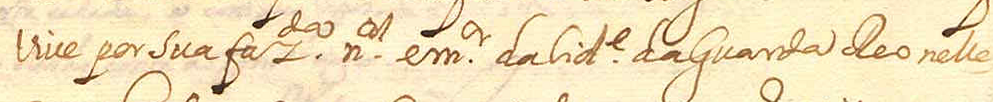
viue por sua faz.da n.al e m.or da Cid.e da Guarda Reo nelle
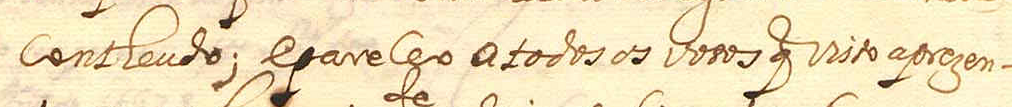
contheudo; e pareceo a todos os votos q̄ visto aprezen
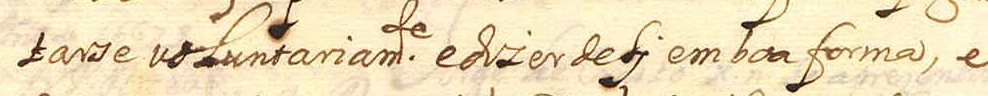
tarse uoluntariam.te e dizer de sj em boa forma, e
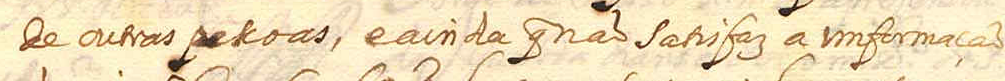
de outras pessoas, e ainda q̄ naõ satisfaz a imformaçaõ
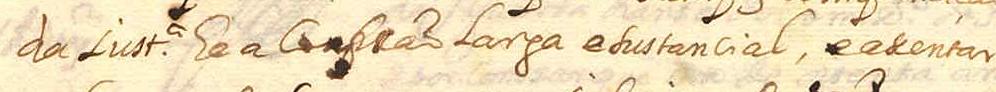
da Iust.a he a Confissão larga e sustancial, e ascentar
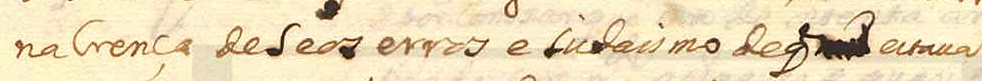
na Crença de seos erros e iudaismo de q̄ naõ estaua
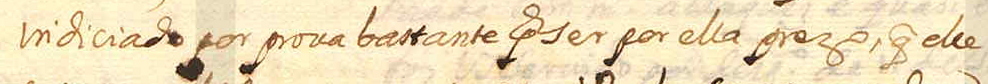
indiciado por proua bastante pa ser por ella prezo, q̄ elle
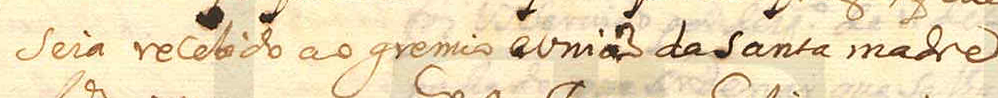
seia recebido ao gremio e vniaõ da santa madre
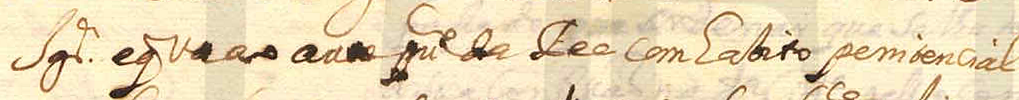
Igr.a e q̄ va ao auto puco da Fee com habito penitencial
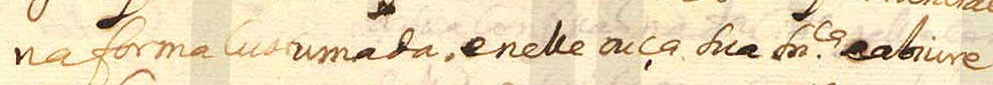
na forma Custumada, e nelle ouça sua sn.ça e abiure
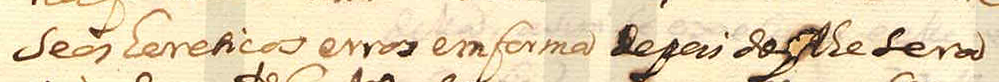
seos hereticos erros em forma depois do q̄ lhe sera
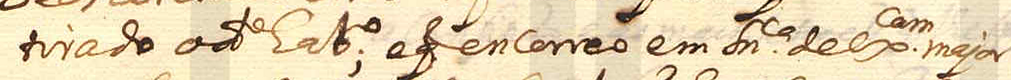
tirado o d̄o hab.o, e q̄ encorreo em sn.ça de ex.cam major
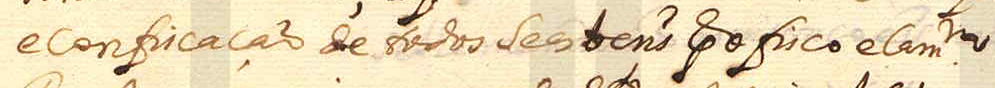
e confiscaçaõ de todos seos bens̄ pa o fisco e cam.ra
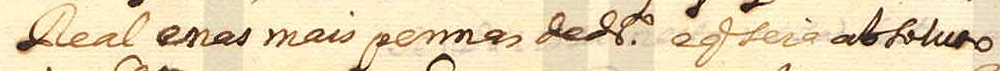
Real e nas mais pennas de dr.to e q̄ seia absoluto
